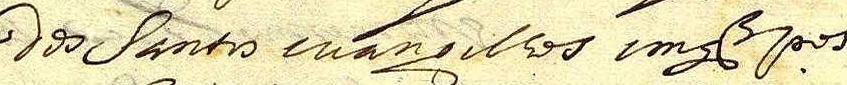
dos Santos euangelhos em q̄ pos
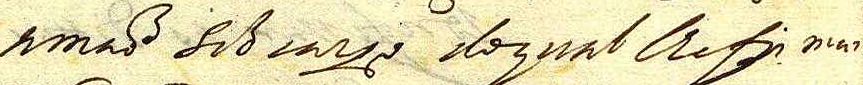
a maõ sob cargo do qual lhe foi man
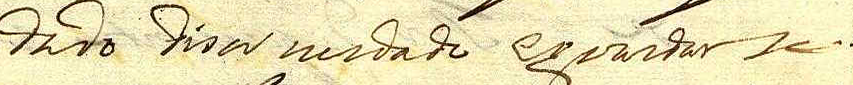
dado diser uerdade e goardar se
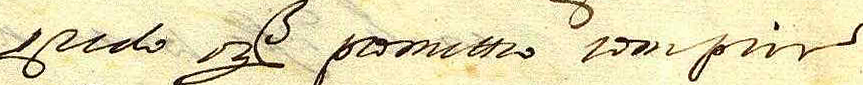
gudo o q̄ prometteo comprir
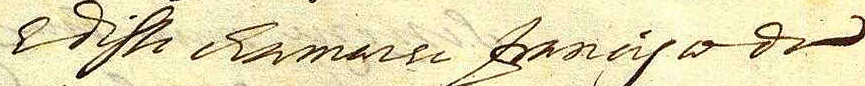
e disse chamarse francisco da
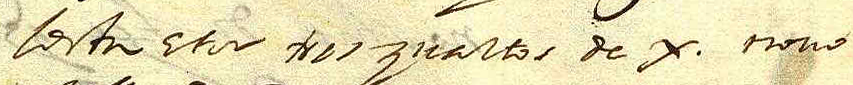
Costa e ter tres quartos de x. nouo
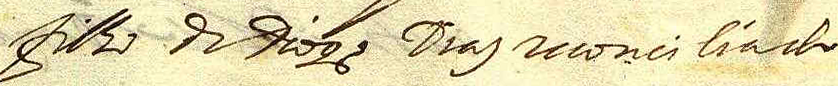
filho de Diogo Dias reconciliado
